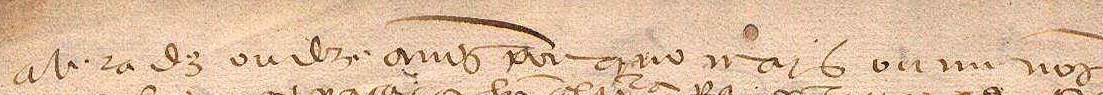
avera dez ou doze anos pouquo mays ou menos
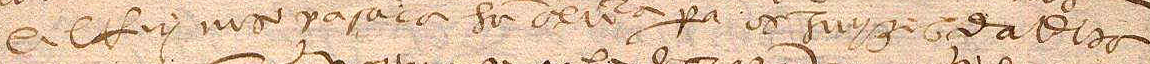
e el Rey niso pasara hū alura ꝑa os Juyzes da dita
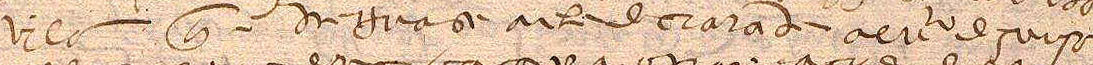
vyla q̄ ētreguase a ele decrarāte aluro de sousa
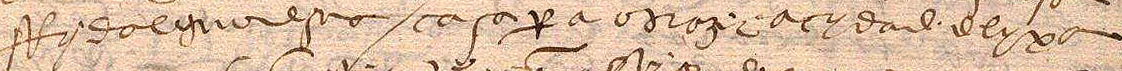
ffydalguo de sua / casa ꝑa o trazer a cydade lyxa
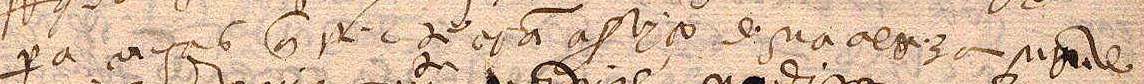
ꝑa cousas q̄ pertēcyā a ꞩvyço de sua alteza segūdo
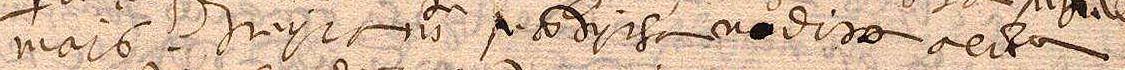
majs ēteyramte se cōtynha no dito alura
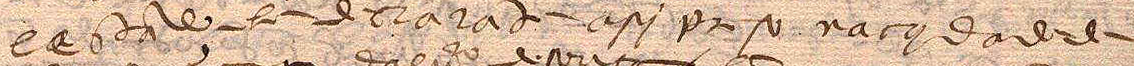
e estādo ele decrarāte asy preso na cydade de
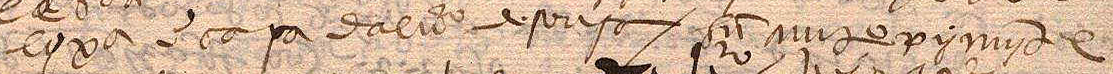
lyxa ē casa daluro de sousa / hū amto pymȳtel
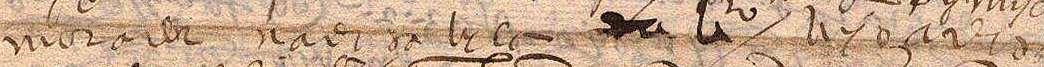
morador na dita vyla davro / veyo a dita
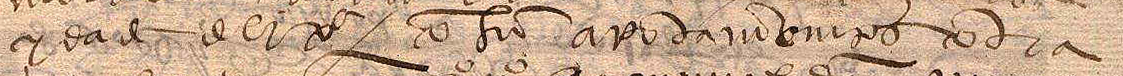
cydade de lixa / c̄o hū apōtamemtos cōtra
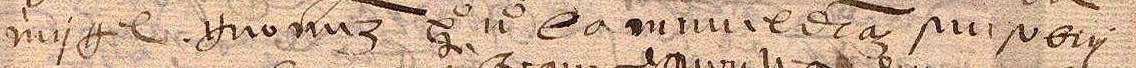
mygel guomez xo no e a manuel diaz seu sobry
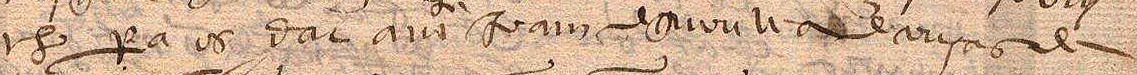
nho ꝑa os dar a mte Joam de guouvea de cousas de
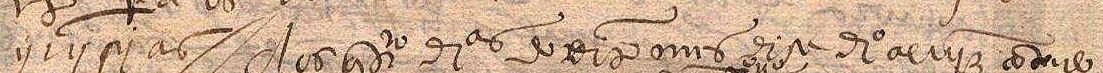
yrysyas / Aos q̄trro djas do dito mes dise djo alur̄z cōtado
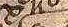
xo no
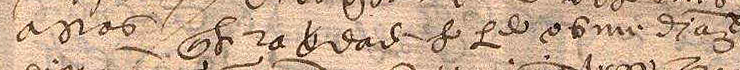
atras q̄ hera ꝟdade ho Ldo cosme diaz
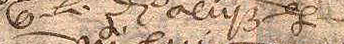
q̄ ele djo alur̄z lhe
